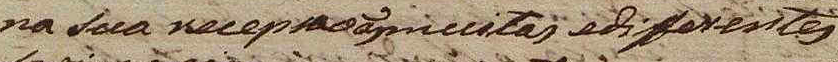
na sua recepsaõ a muitas e differentes
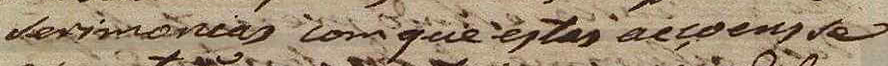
serimonias, com que estas acçoens se
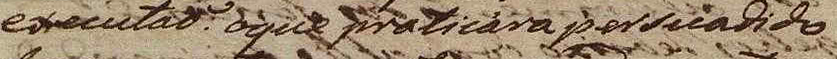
executaõ o que praticava persuadido
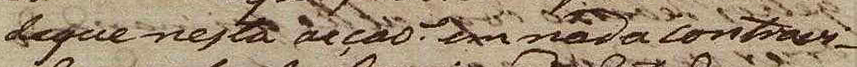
de que nesta acçaõ em nada contravi
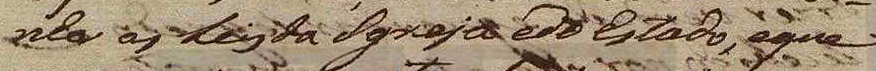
nha as Leis da Igreja e do Estado, e que
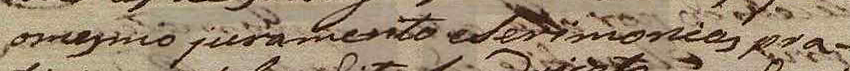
o mesmo juramento, e Serimonias pra
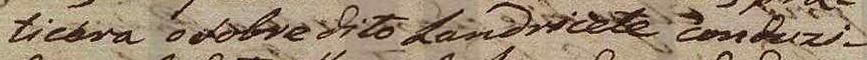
ticara o sobredito Landricete conduzi
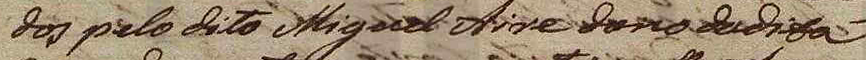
dos pelo dito Miguel Aire dono da dita
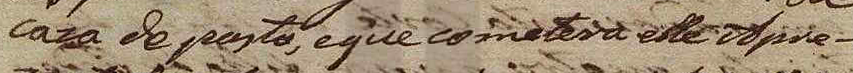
caza de posto, e que cometera este Apre
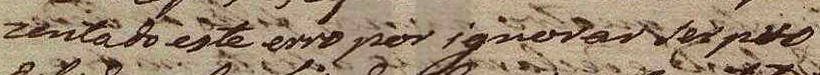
zentado este erro por ignorar ser pro
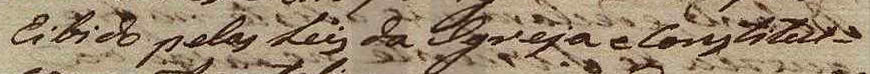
hibido pelas Leis da Igreja, e constitui
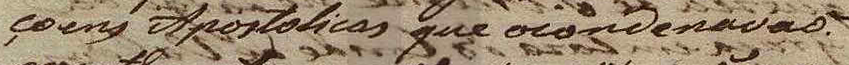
çoens Apostolicas que o condenavaõ
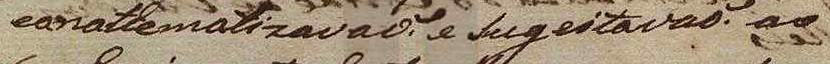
e anathematizavaõ e sugeitavaõ ao
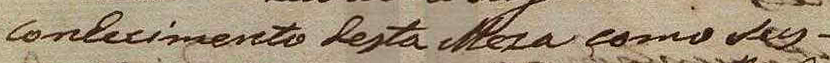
conhecimento desta Meza como sus
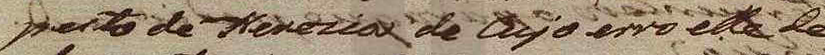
peito de Herezia de cujo erro elle de
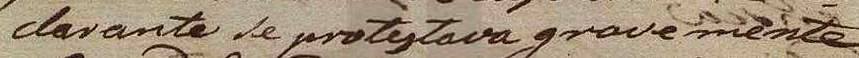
clarante se protestava gravemente
